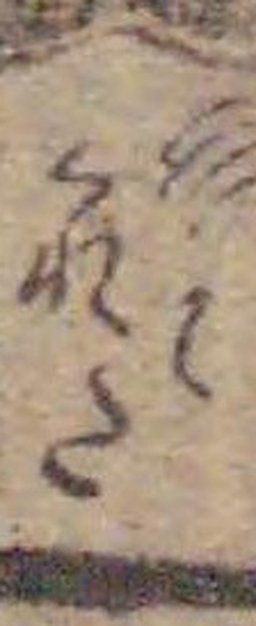くれた
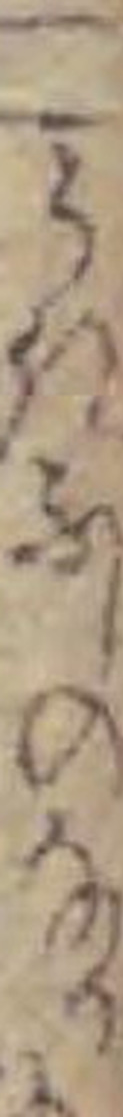うきふしのなかに
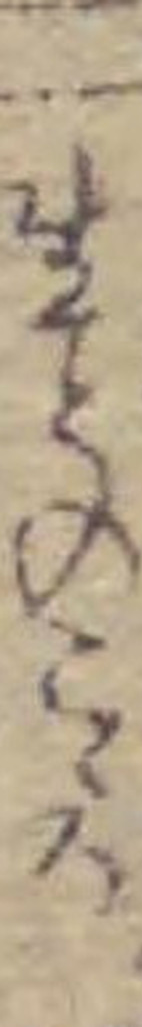まことのこゝろ
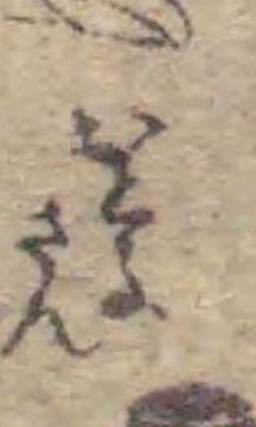おとよ
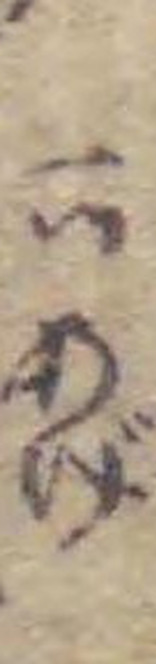一つあげ
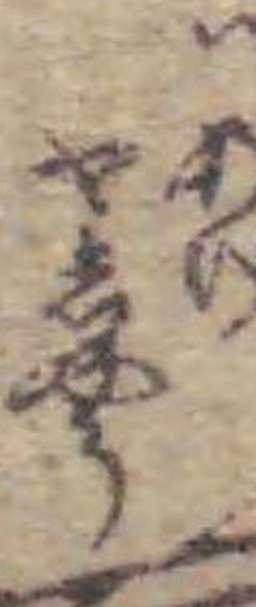やしやう
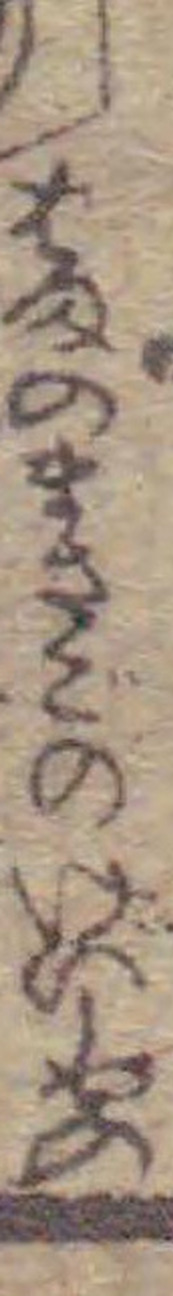はまのまさごのげいしやの
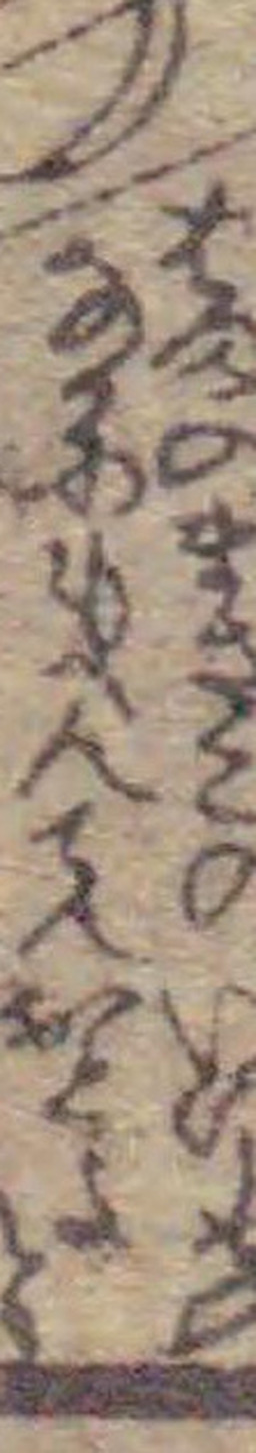なかにもへんてんおとよ
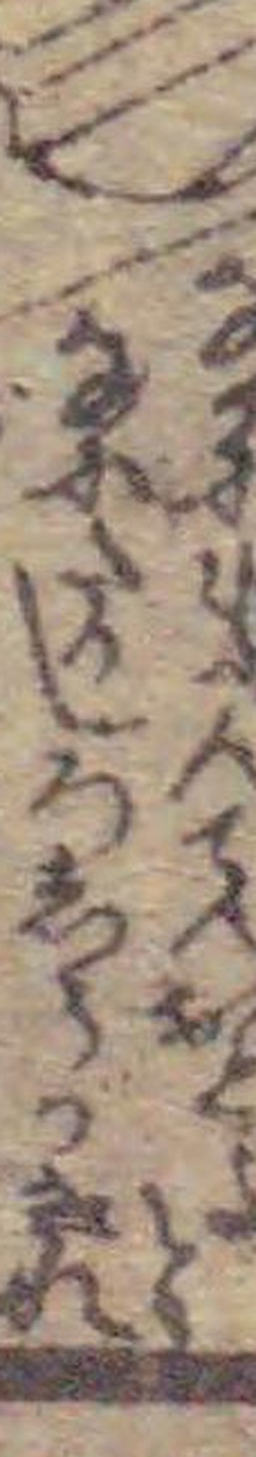なにたかしろしうがきれ
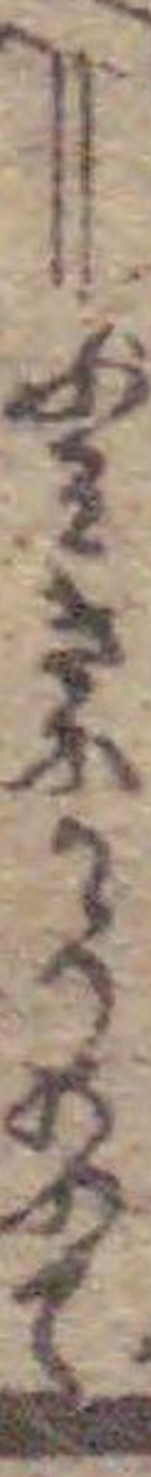ぶみきにかゝりあふて
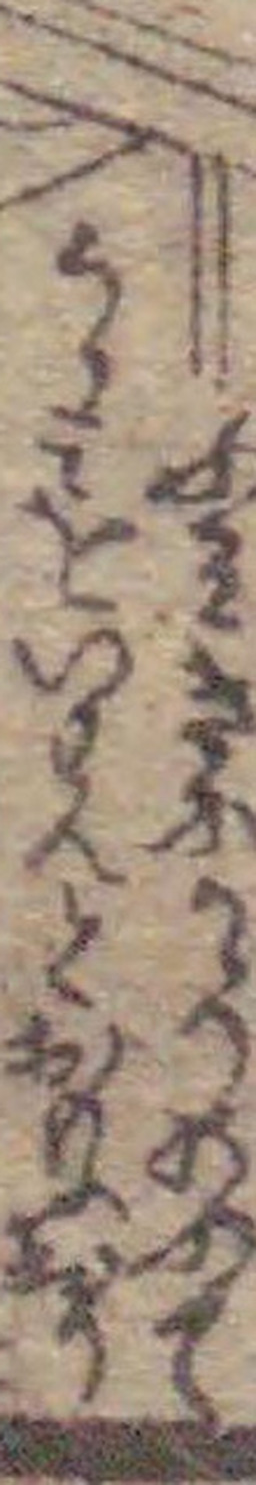うらみをいわんとおもふおり
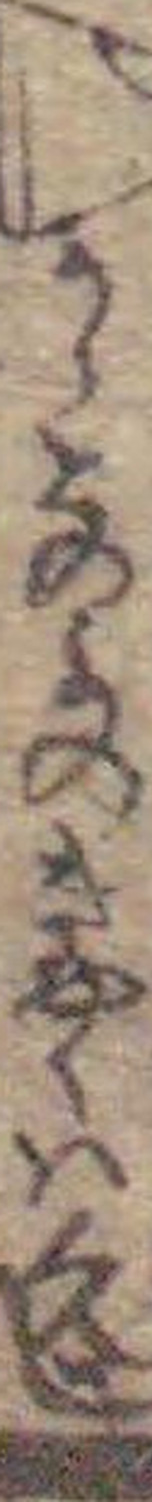からこのよのきやくはくんじ
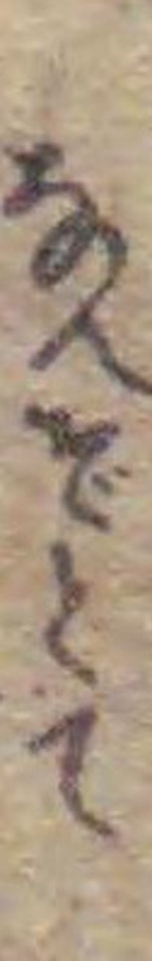なんぞとて
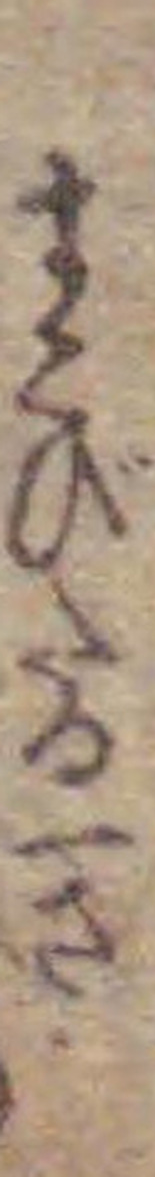すこびたる一さ

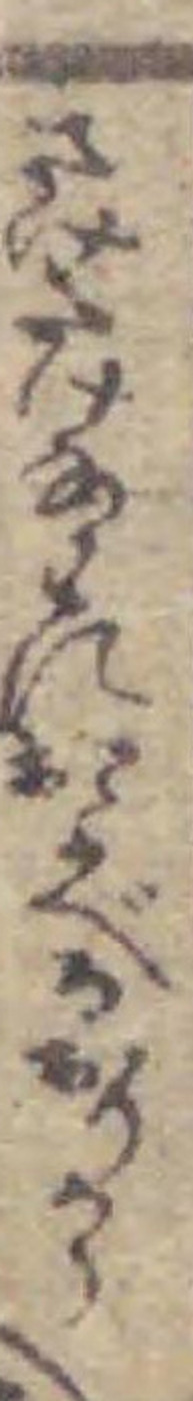さけたけなわにおよべるおりから
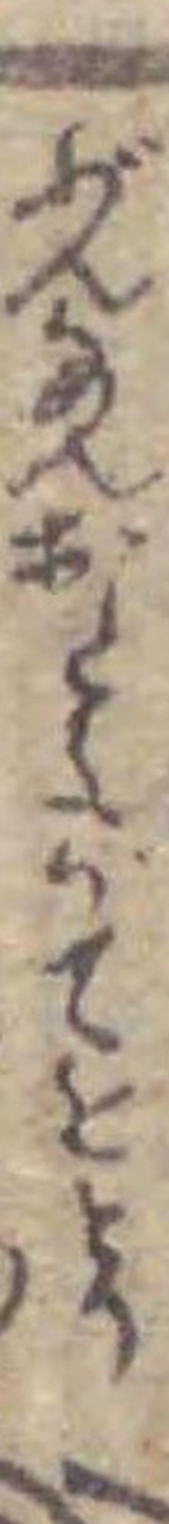ぶんなんおとよがてをとり
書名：芸者呼子鳥 : 2巻（松泉堂）
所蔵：国立国会図書館 National Diet Library, JAPAN
